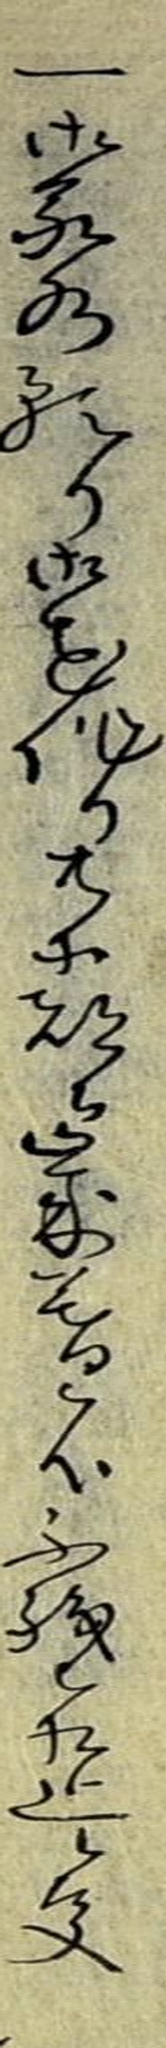一御泉水預り御花作り共に都而歳暮被下不残被相止候事
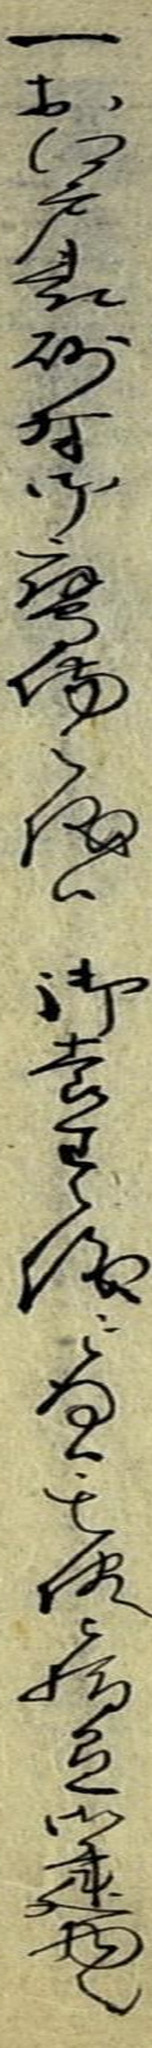一於江戸表砂村御鷹場之儀は御養生之儀に候得は其侭被指置御建物之
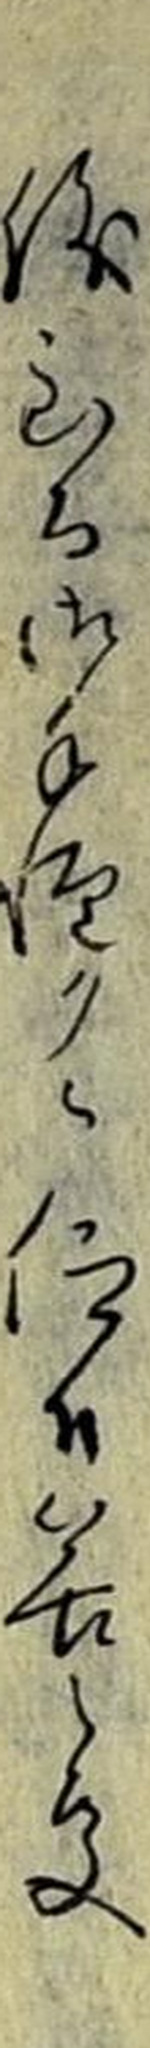儀至而御手軽く被仰付筈美之事
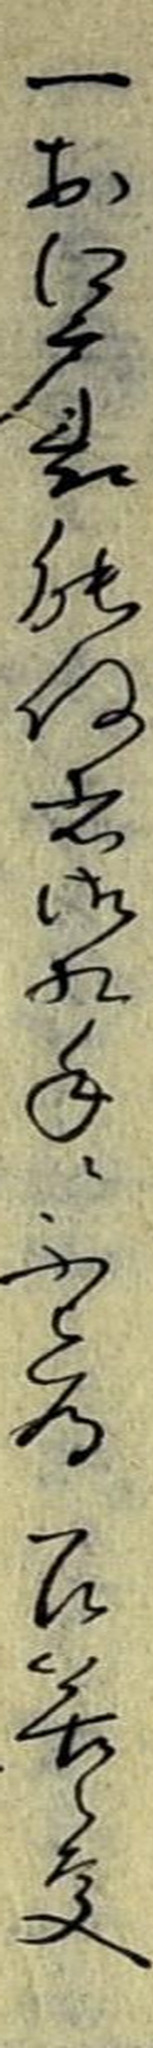一於江戸表能役者御相手に不被為召筈之事
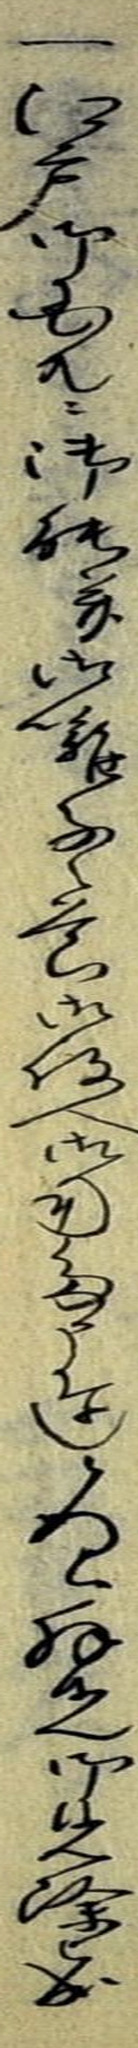一江戸御国共に御能并御囃子之節御役人御用多申達候得は拝見御見除被成
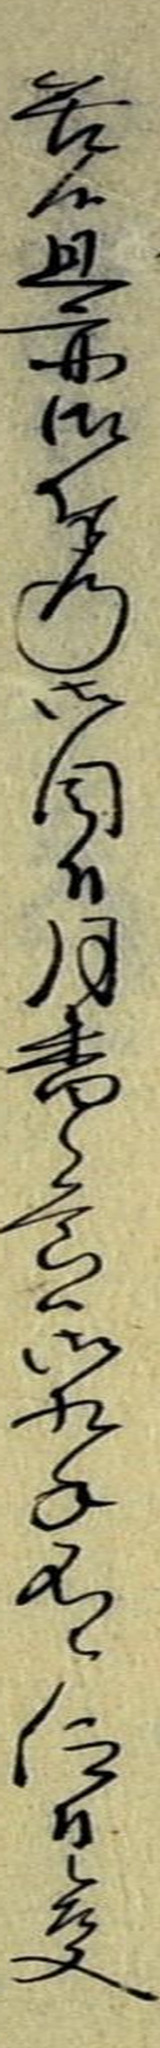筈候且亦御奉行御目付月番之節は御相手不被仰付候事
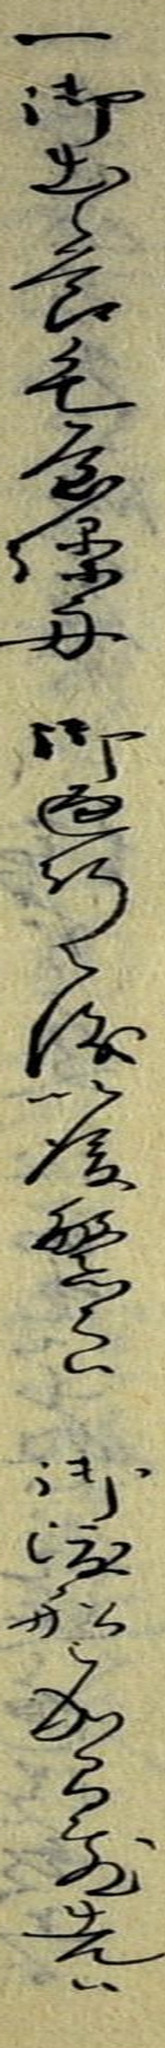一御出之節毛屋繰舟御通行之儀以後繁々は御渡船被成間敷先は
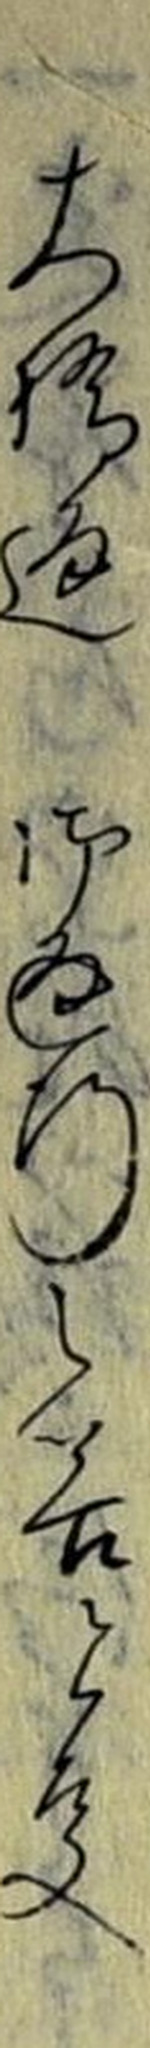大橋通御通行之筈に候事
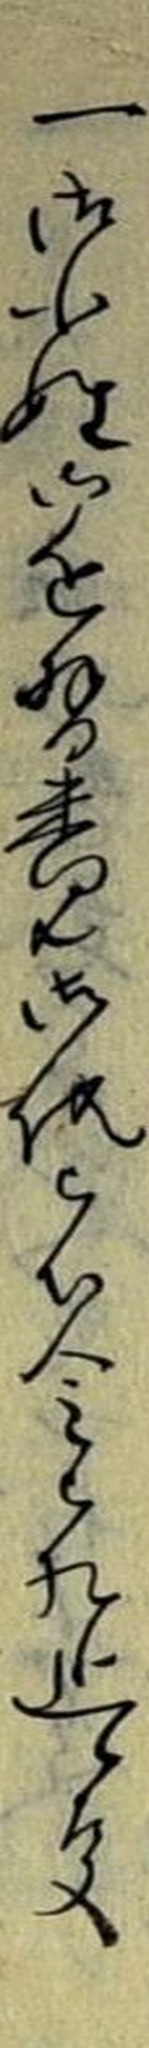一御小姓御近習番共御供被下金被相止候事
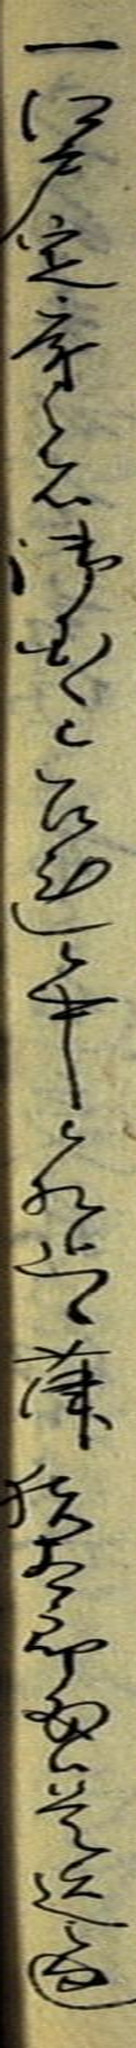一江戸定府之者御国へ被召連候事被相止候葎猪太郎義は是迄之通
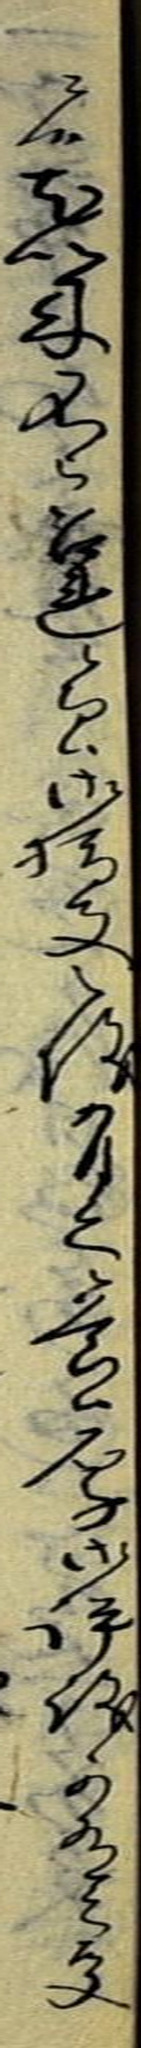に候尤以来不被召連候而は御指支之儀有之候節は厚御評議可有之事
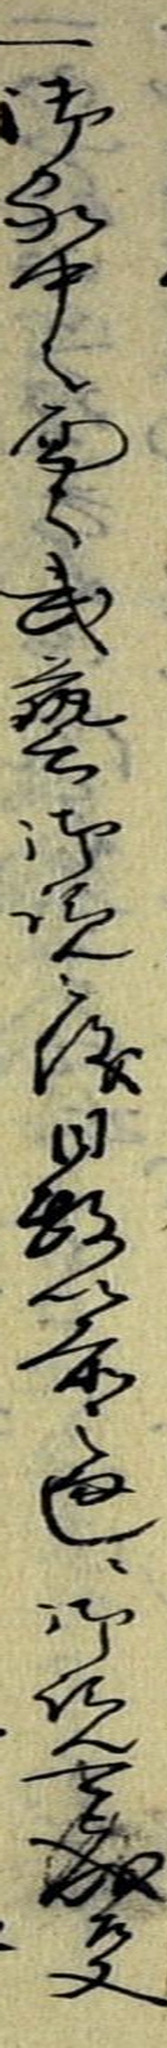一御家中之面々武芸御覧之儀日数以前之通に御覧可被成事
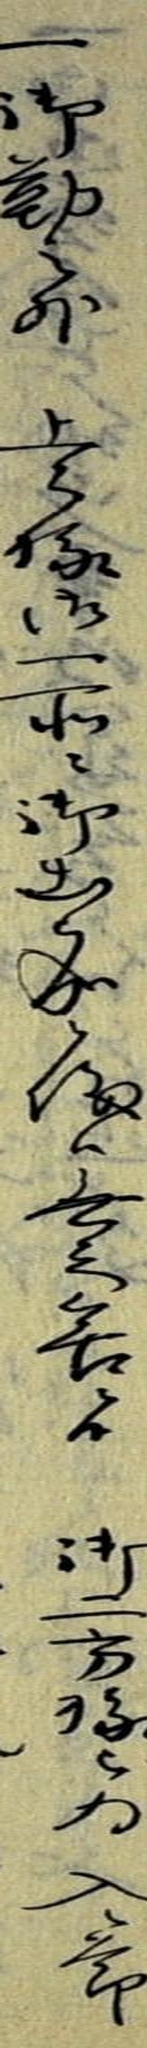一御勤之外上々様御一所に御出被成候儀は無之筈に候御二方様被為入候節
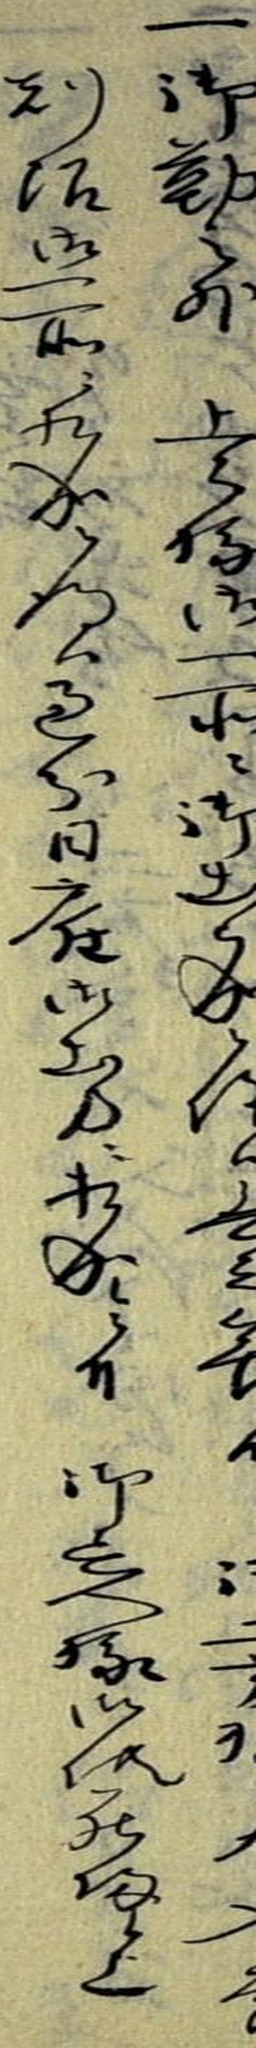刻限御一所に相成候得は過分日雇御出方に相成候に付御壱人様御供罷帰候上
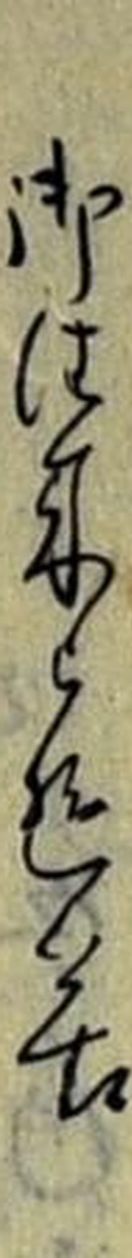御往来被遊筈
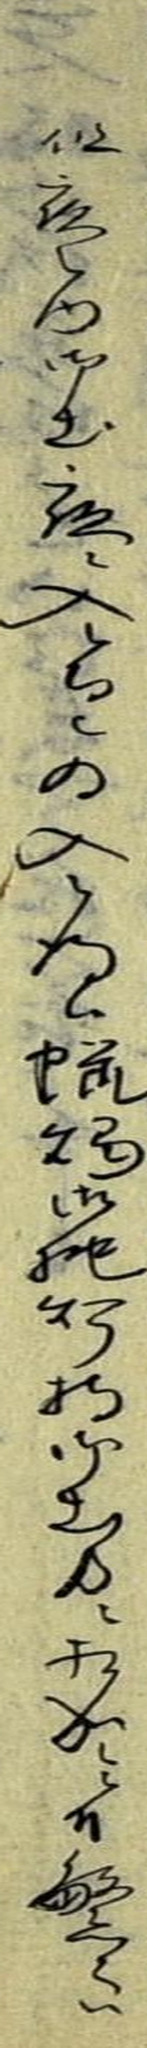但夜之内御出夜に入候而被為入候得は蝋燭御挑灯持御出方に相成候に付繁々は
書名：命令之部 二
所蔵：福井県文書館 Fukui Prefectural Archives
